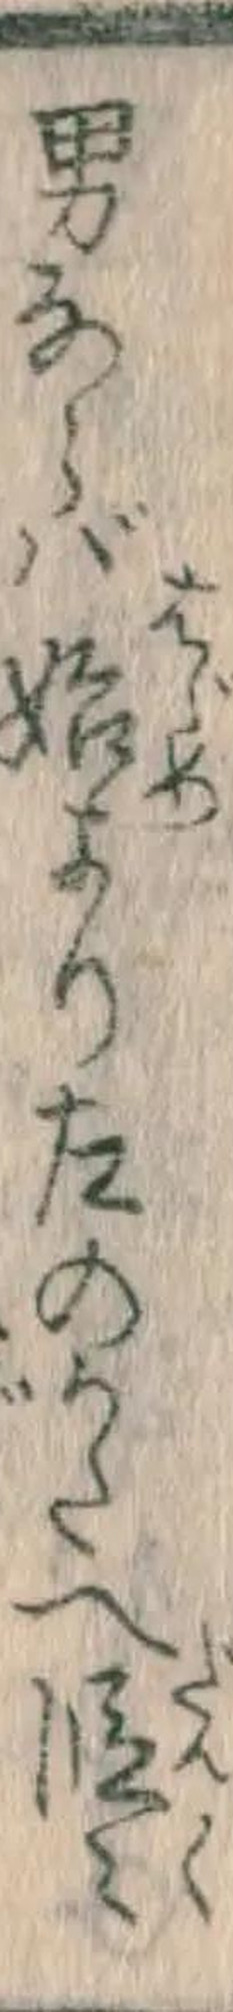男ならば始より左のかたへ段々
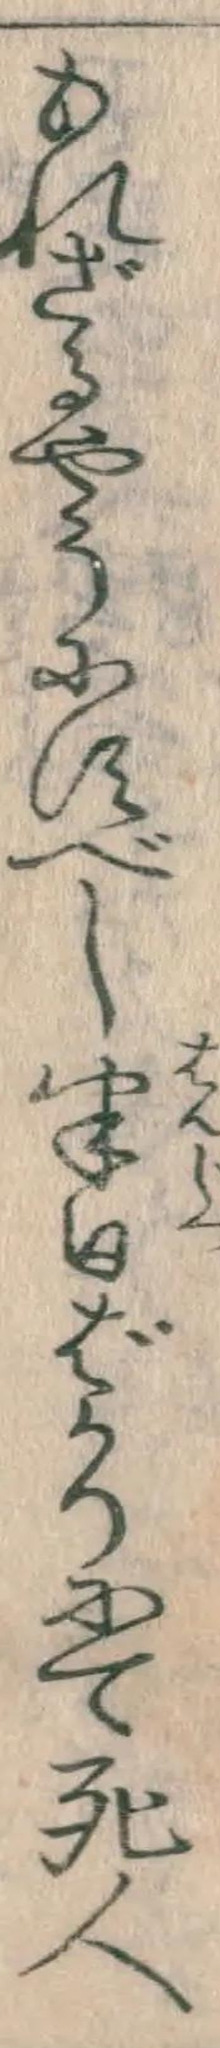もれざるやうにすべし半日ばかりにて死人
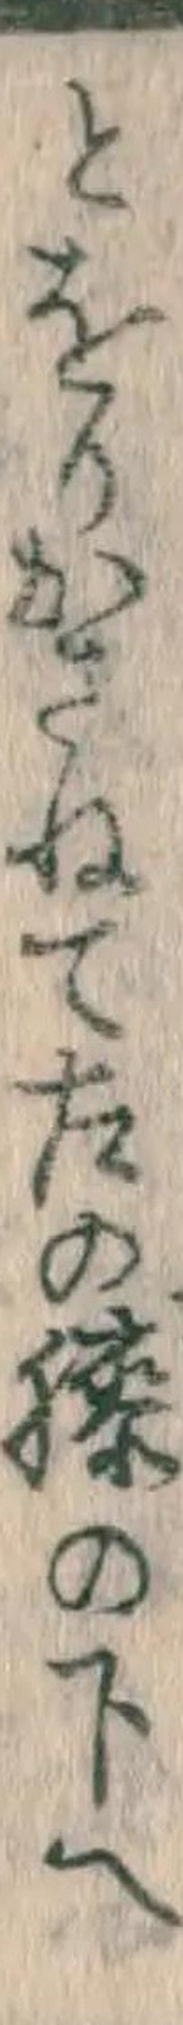とをりかさねて左の膝の下へ
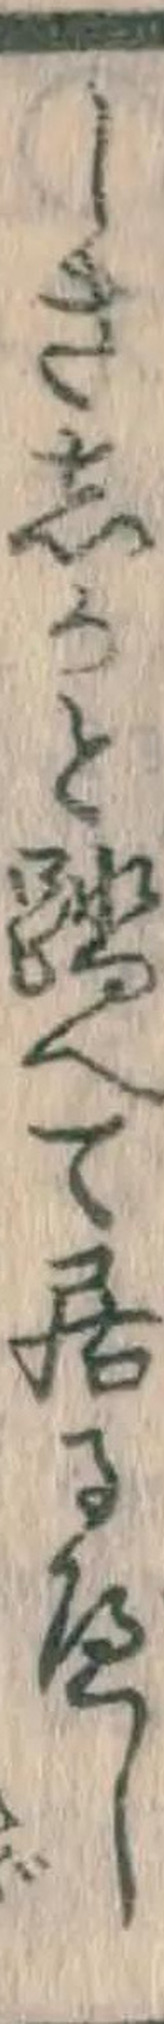しきしかと踏へて居るべし
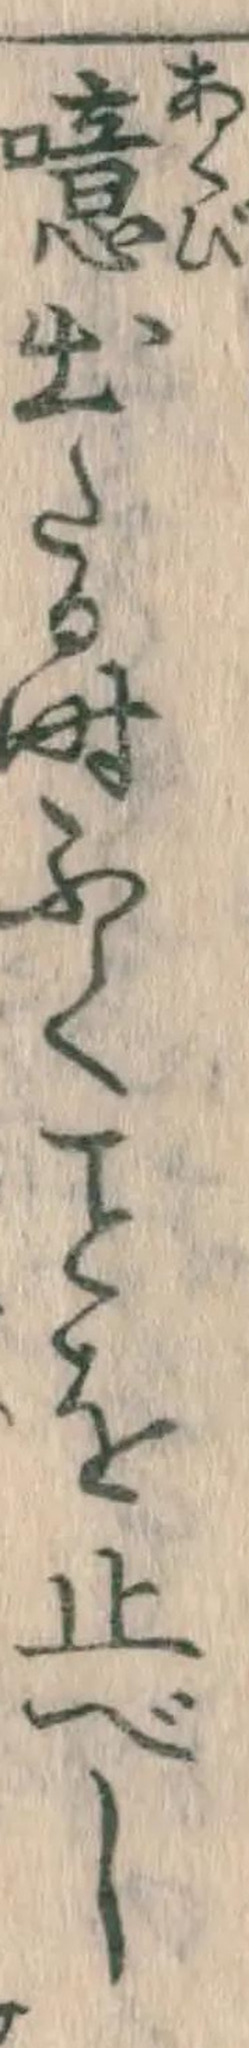噫出たる時ふくことを止べし
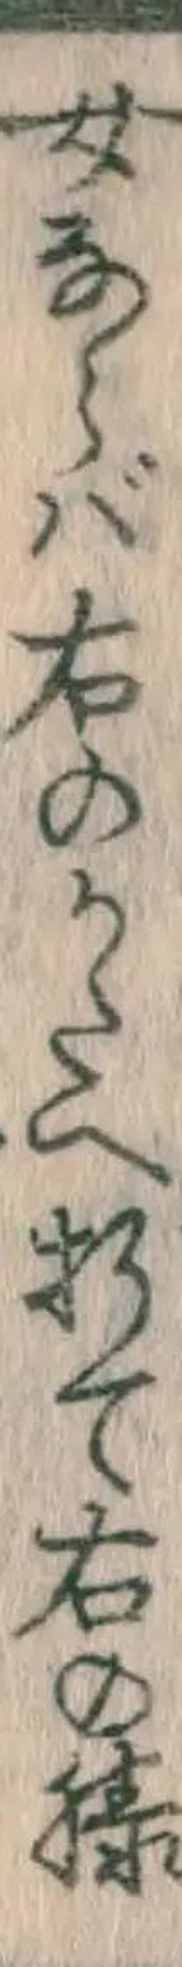女ならば右のかたへ折て右の膝
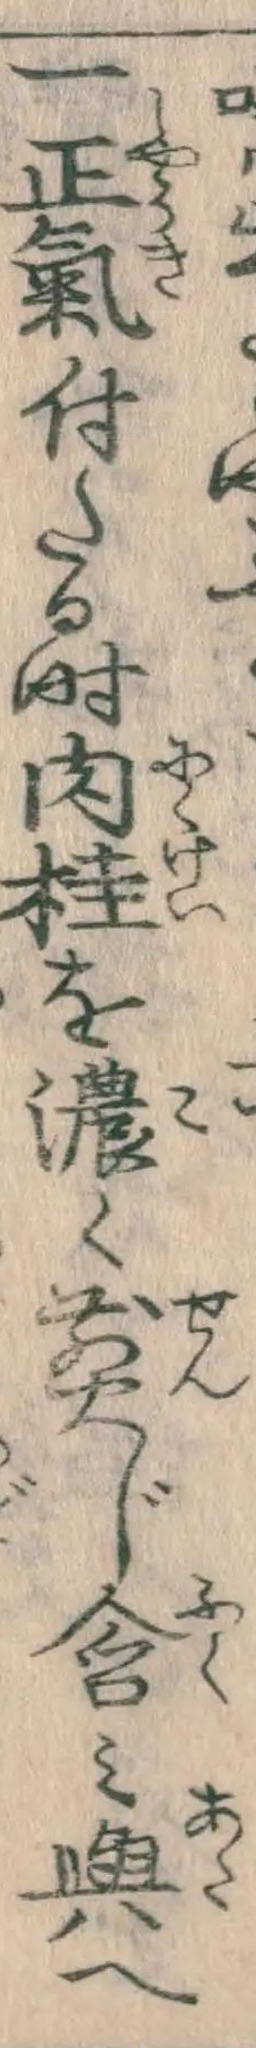一正気付たる時肉桂を濃く煎じ含み与へ
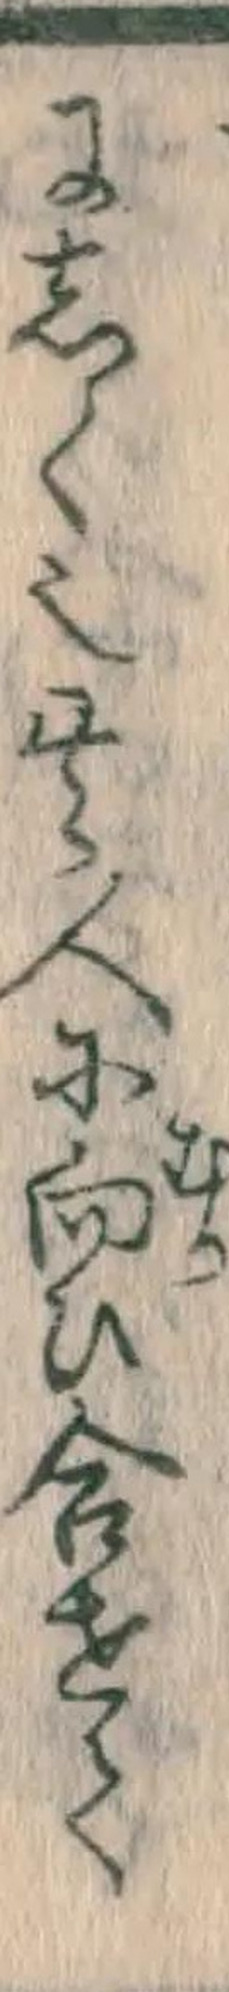にしく也其人に向ひ合せて
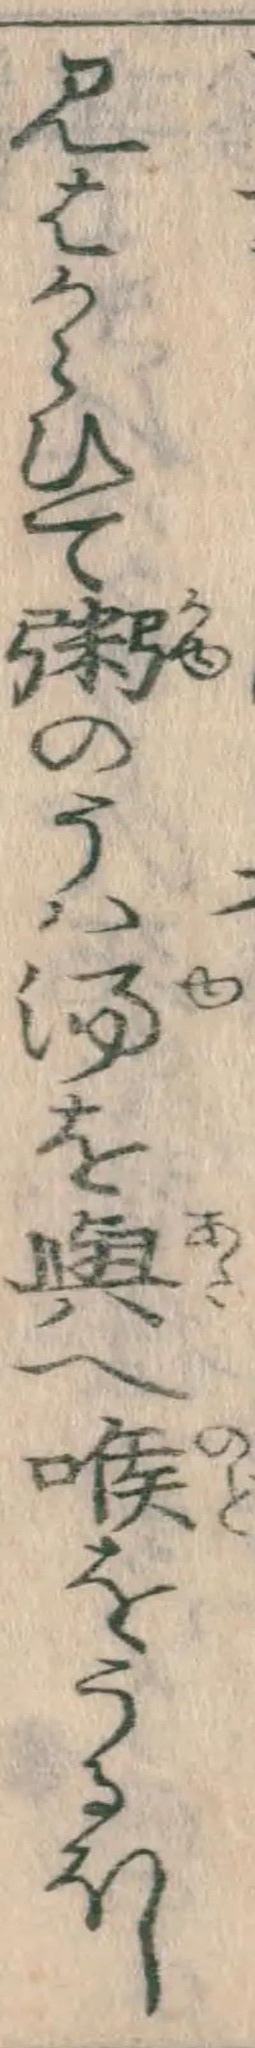見はからひて粥のうは湯を与へ喉をうるほし
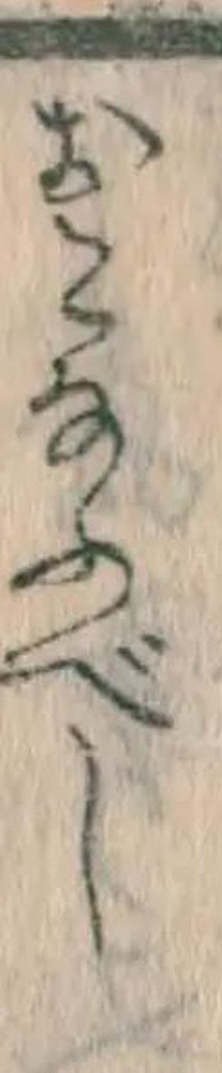おこなふべし
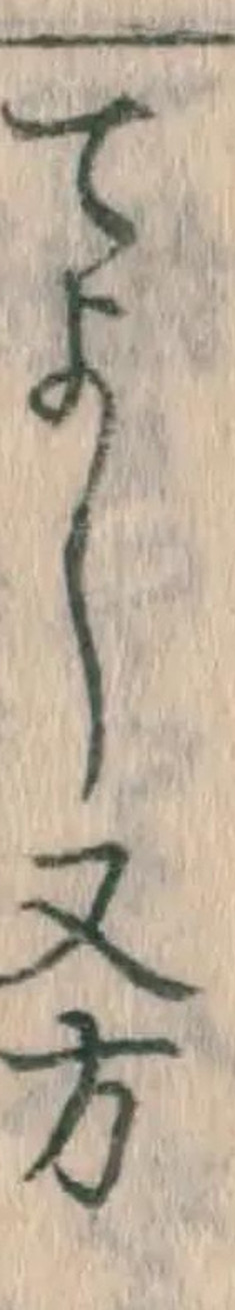てよし又方
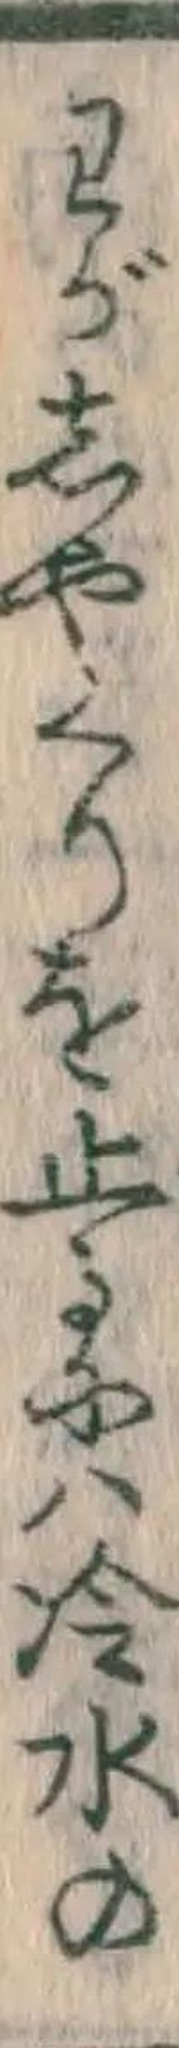わがしやくりを止るには冷水の
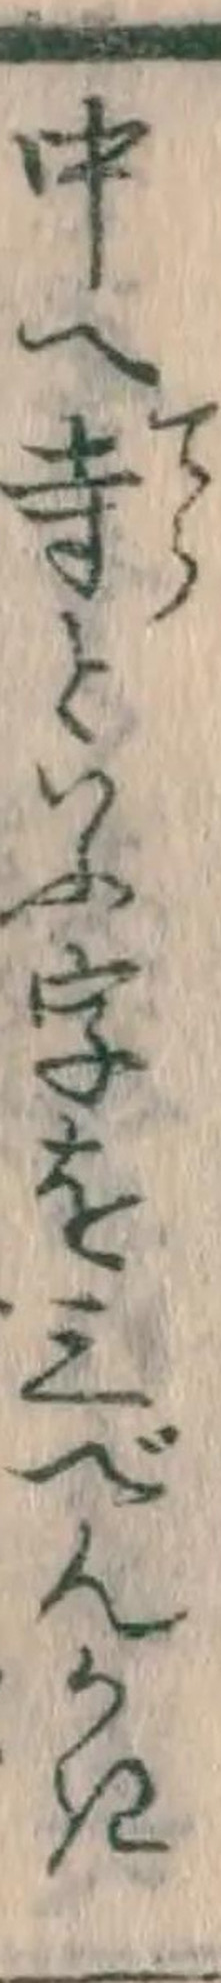中へ寺といふ字を三べんかき
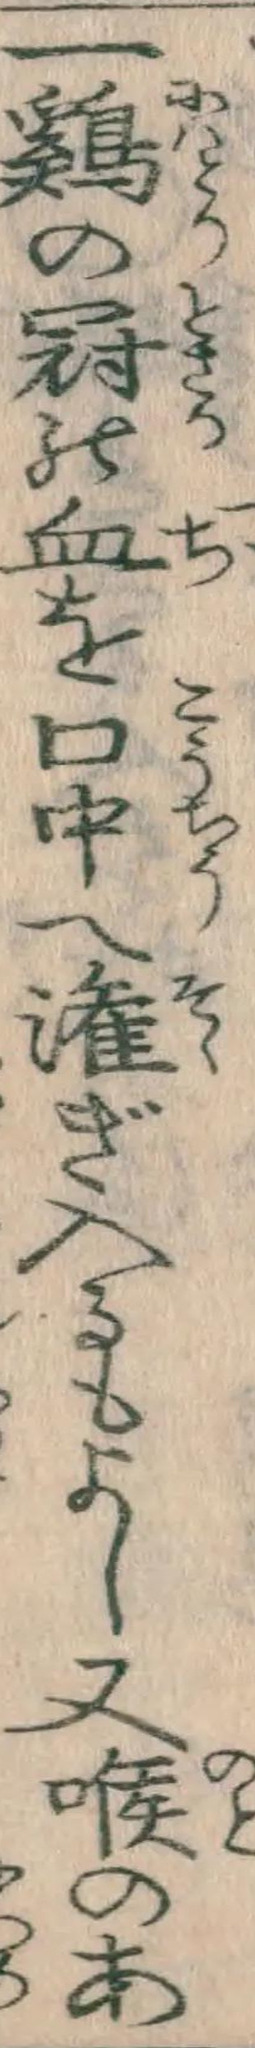一鶏の冠の血を口中へ灌ぎ入るもよし又喉のあ
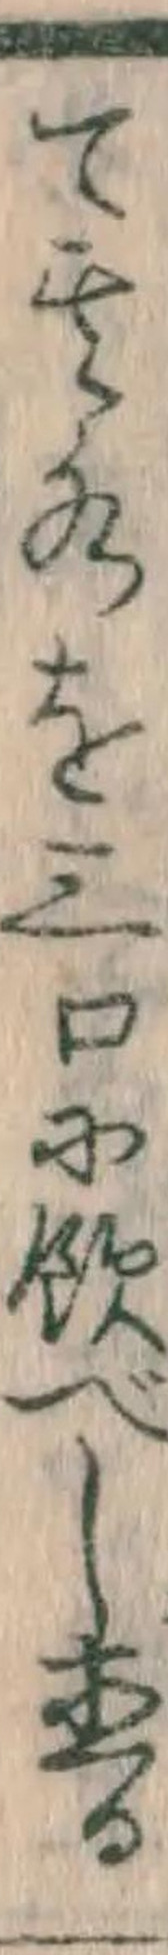て其水を三口に飲べし直る
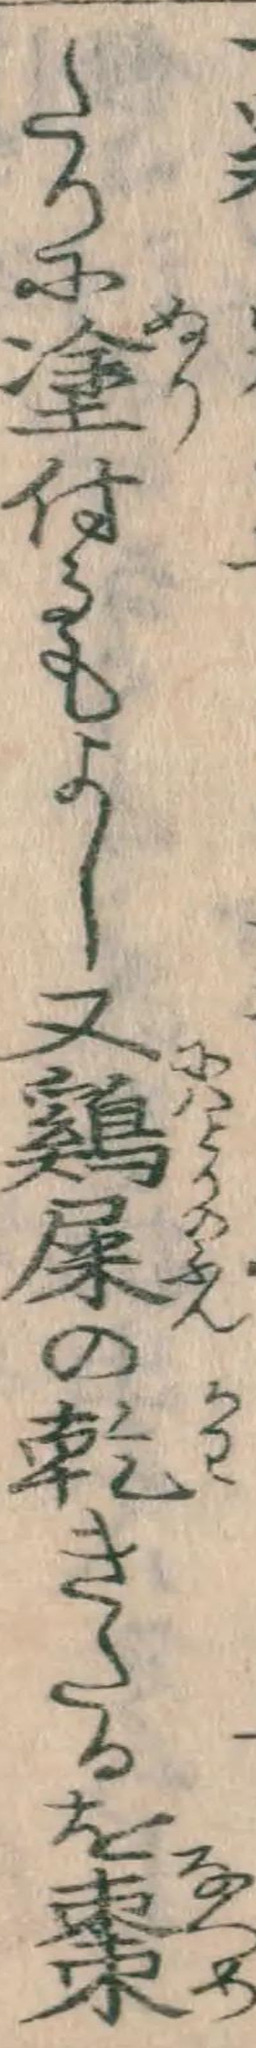たりに塗付るもよし又鶏屎の乾きたるを棗
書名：広益秘事大全 3巻. [4]
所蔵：国立国会図書館 National Diet Library, JAPAN
